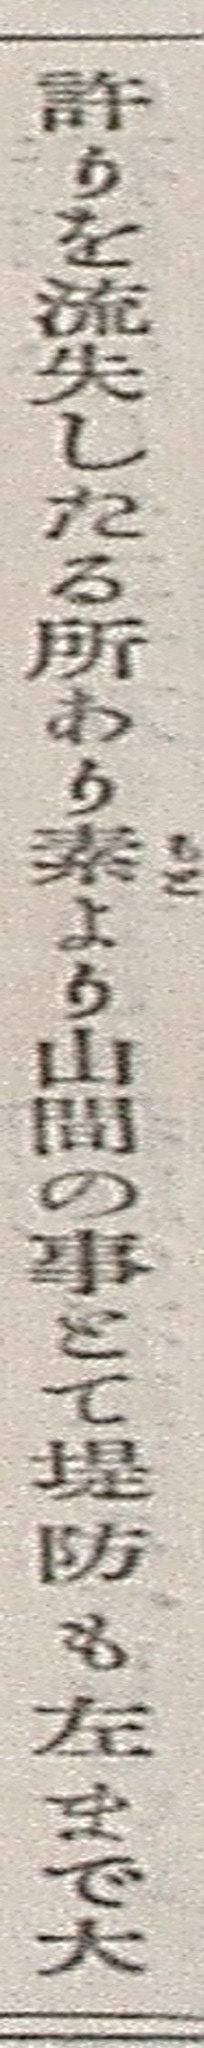許りを流失したる所あり素より山間の事とて堤防も左まで大
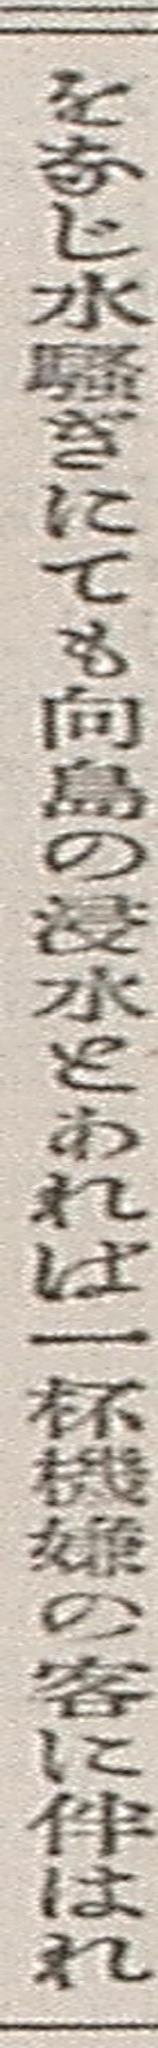をなじ水騒ぎにても向島の浸水とあれば一杯機嫌の客に伴はれ
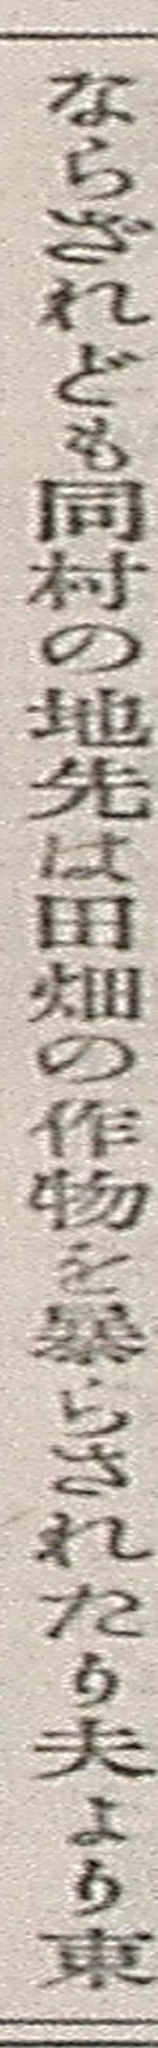ならざれども同村の地先は田畑の作物を暴らされたり夫より東
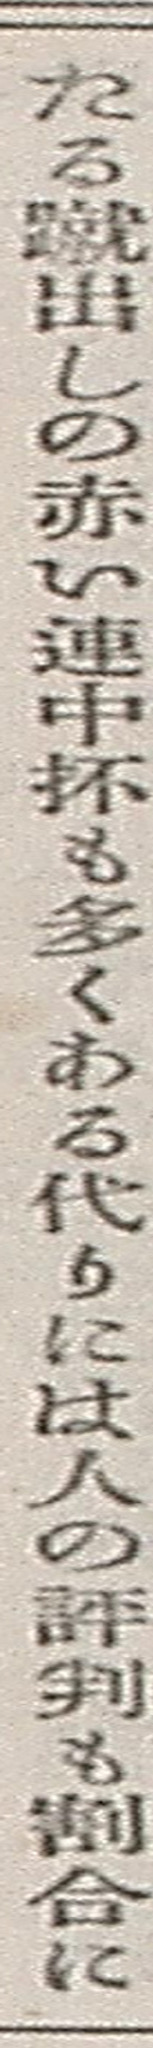たる蹴出しの赤い連中抔も多くある代りには人の評判も割合に
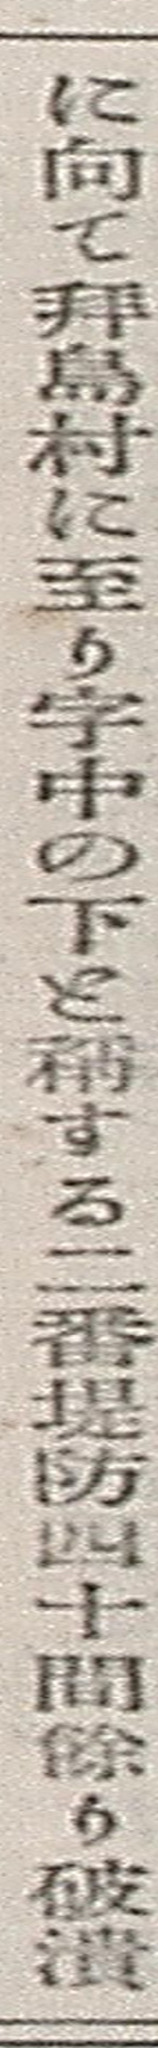に向て拝島村に至り字中の下と称する二番堤防四十間余り破潰
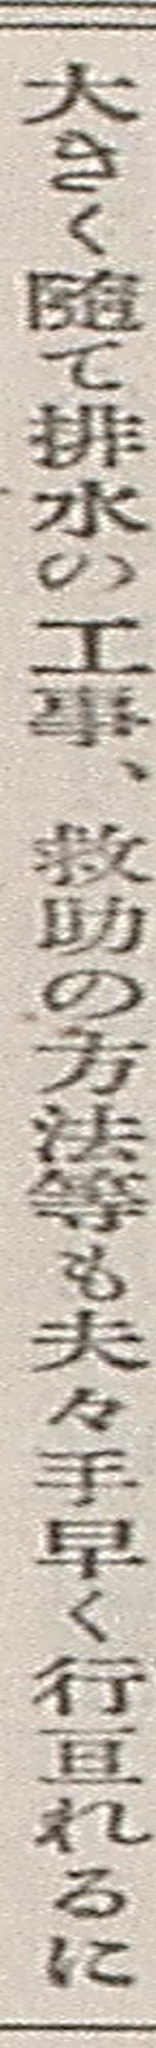大きく随て排水の工事、救助の方法等も夫々手早く行亘れるに
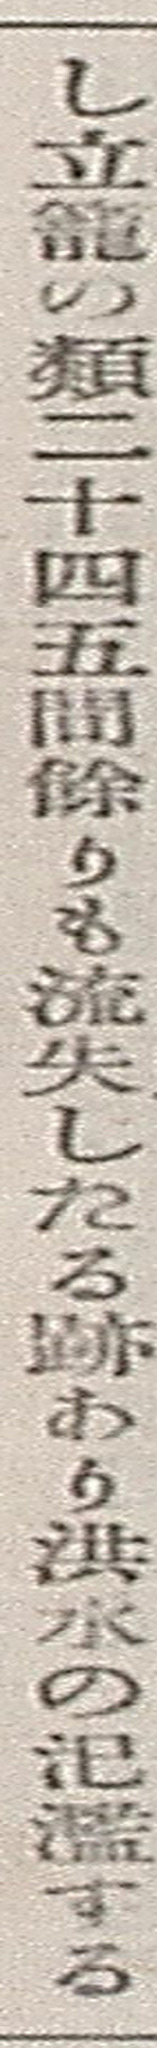し立籠の類二十四五間余りも流失したる跡あり洪水の氾濫する
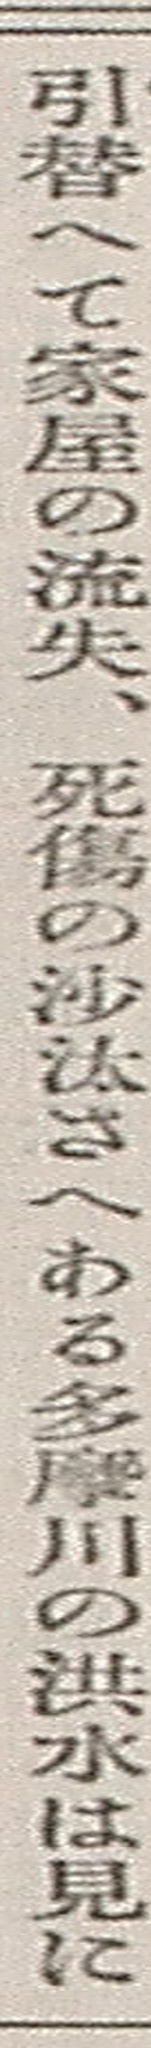引替へて家屋の流失、死傷の沙汰さへある多摩川の洪水は見に
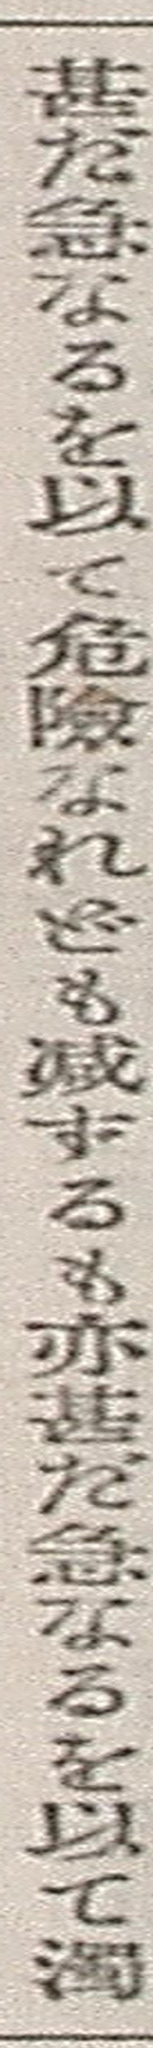甚だ急なるを以て危険なれども減ずるも亦甚だ急なるを以て濁
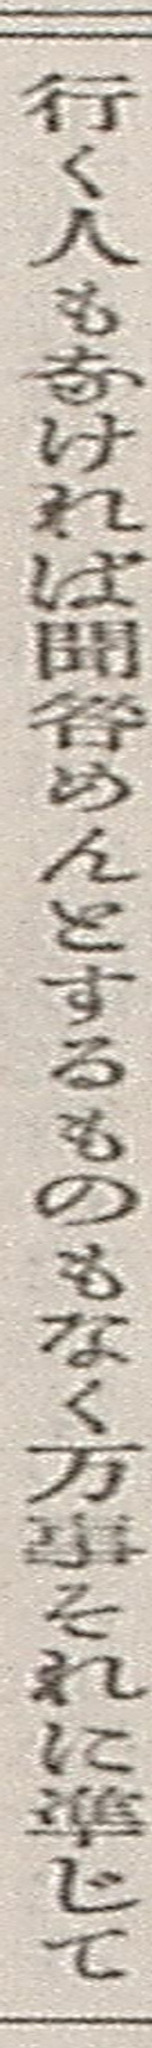行く人もなければ聞咎めんとするものもなく万事それに準じて
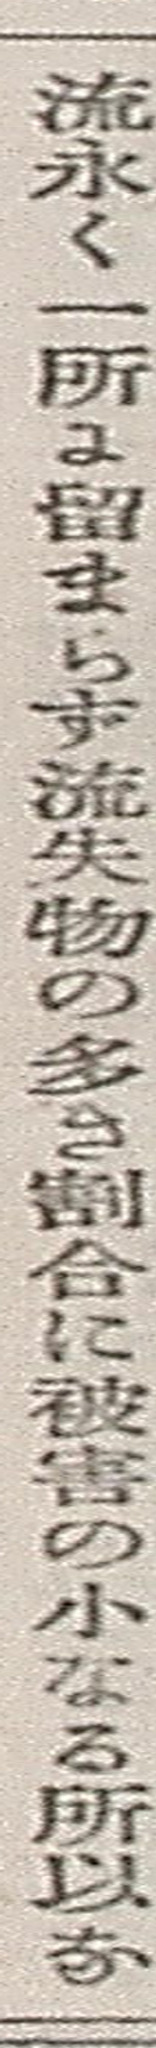流永く一所に留まらず流失物の多き割合に被害の小なる所以な
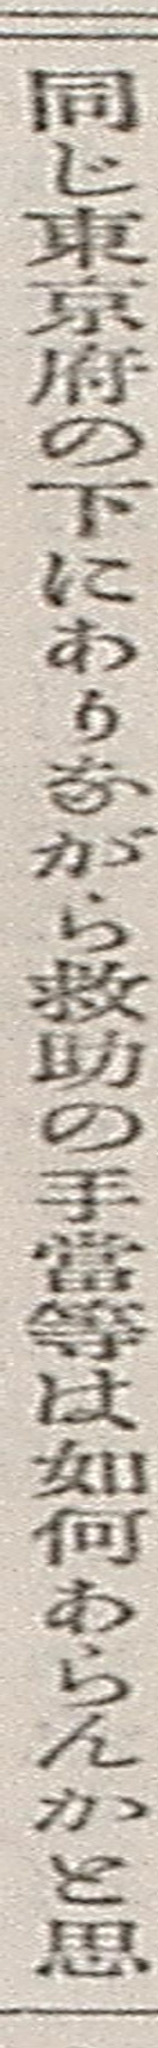同じ東京府の下にありながら救助の手当等は如何あらんかと思
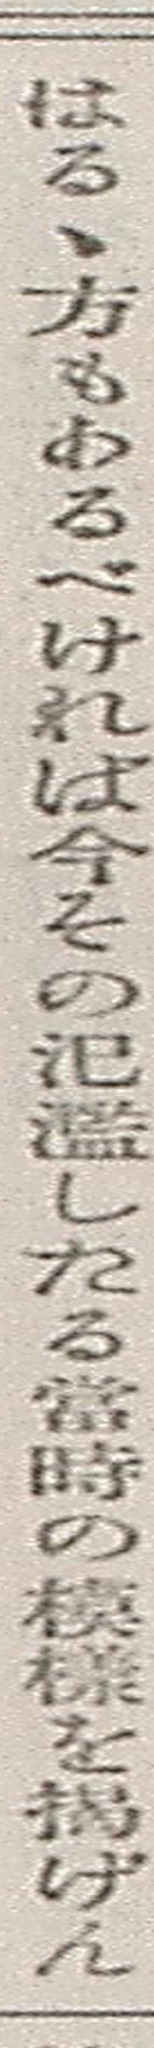はるゝ方もあるべければ今その氾濫したる当時の模様を掲げん
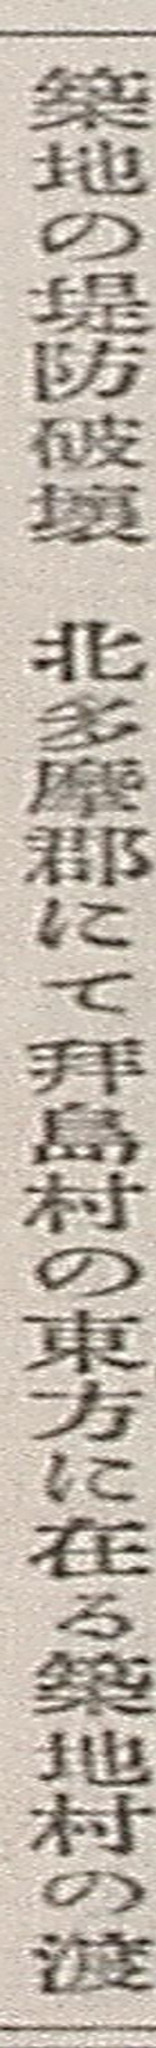筑地の堤防破壊北多摩郡にて拝島村の東方に在る筑地村の渡
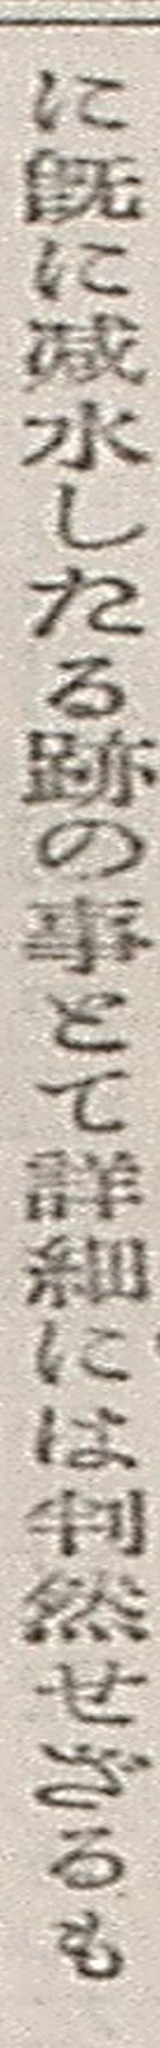に既に減水したる跡の事とて詳細には判然せざるも
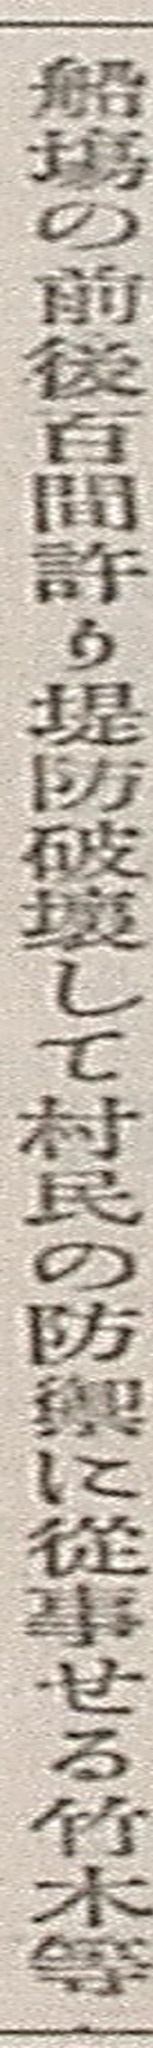船場の前後百閒許り堤防破壊して村民の防禦に従事せる竹木等
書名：風俗畫報臨時増刊第百二十四號　洪水地震被害録（上）
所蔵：東京大学地震研究所図書室 Earthquake Research Institute Library, The University of Tokyo, JAPAN
